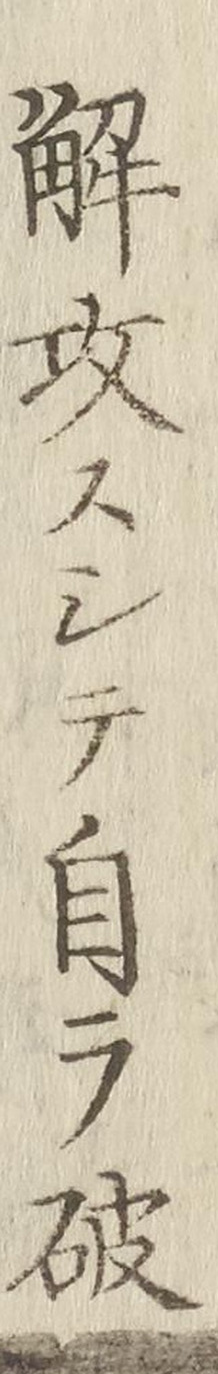解攻スシテ自ラ破
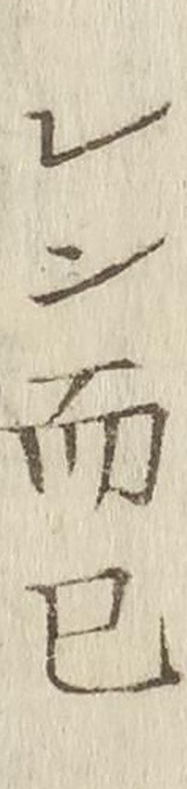レン而已

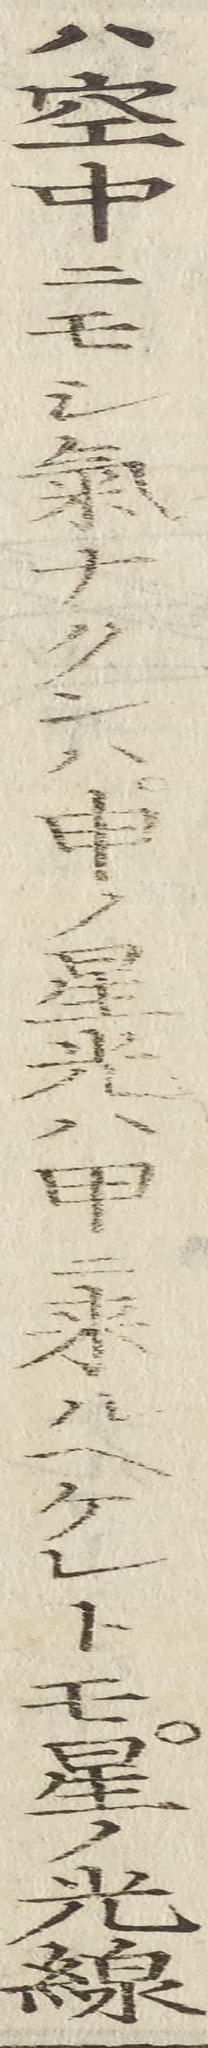ハ空中ニモシ気ナクンハ。申ノ星光ハ甲ニ来ルヘケレトモ。星ノ光線
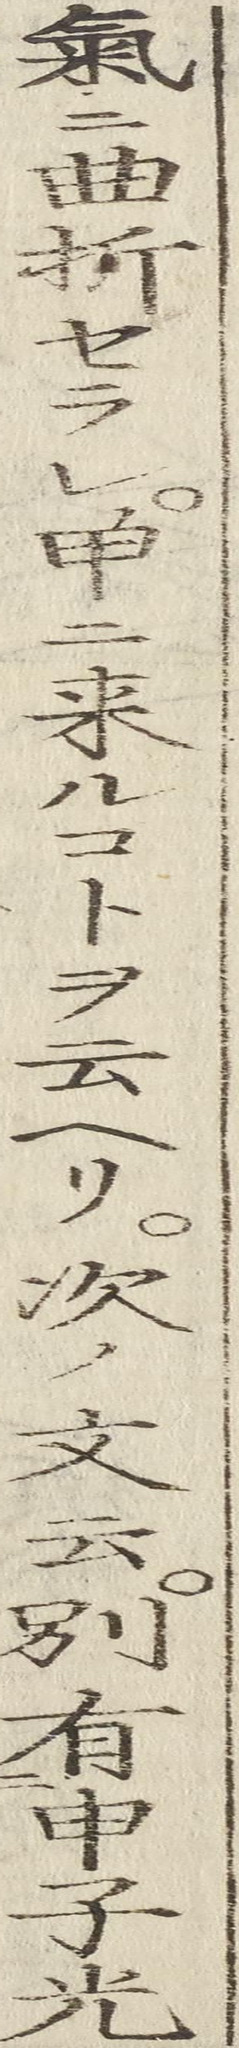気ニ曲折セラレ。‐甲ニ来ルコトヲ云ヘリ。次ノ文云。別有ニ申子光
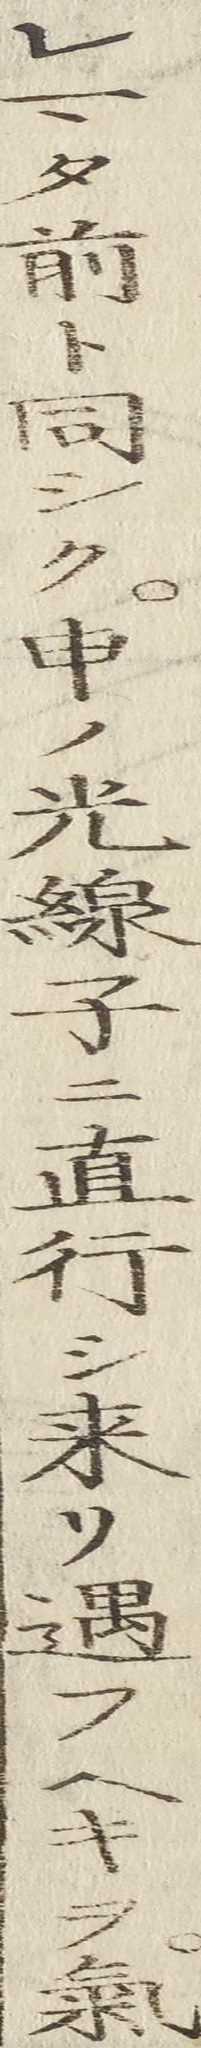レマタ前ト同シク。申ノ光線子ニ直行シ来リ遇フヘキヲ。気
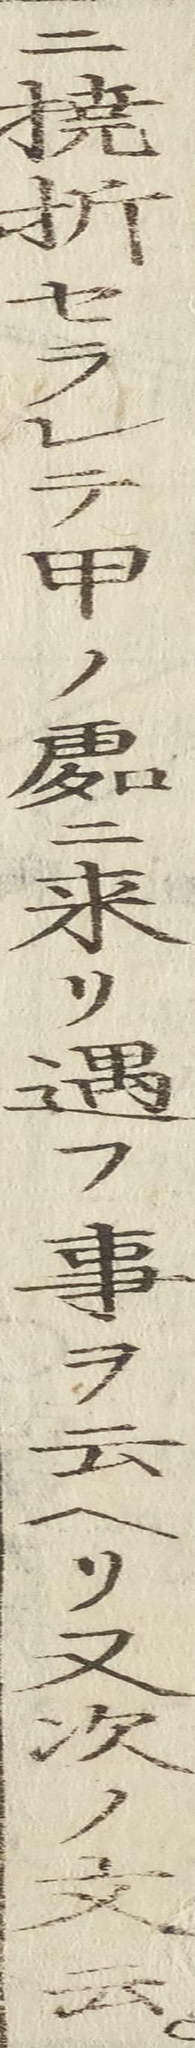ニ撓折セラレテ甲ノ処ニ来リ遇フ事ヲ云ヘリ又次ノ文云。
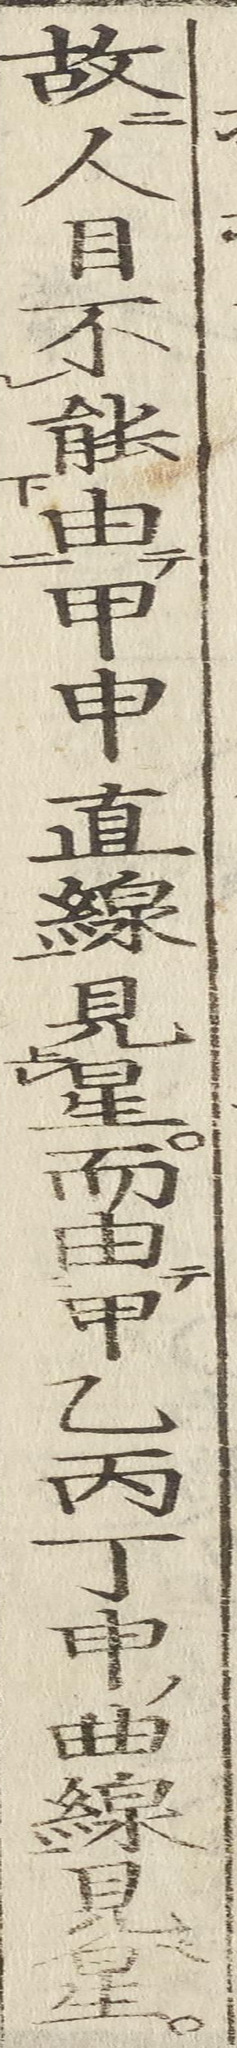故人目不能由ニ甲申直線見レ星。而由ニ甲乙丙丁申曲線見也星。
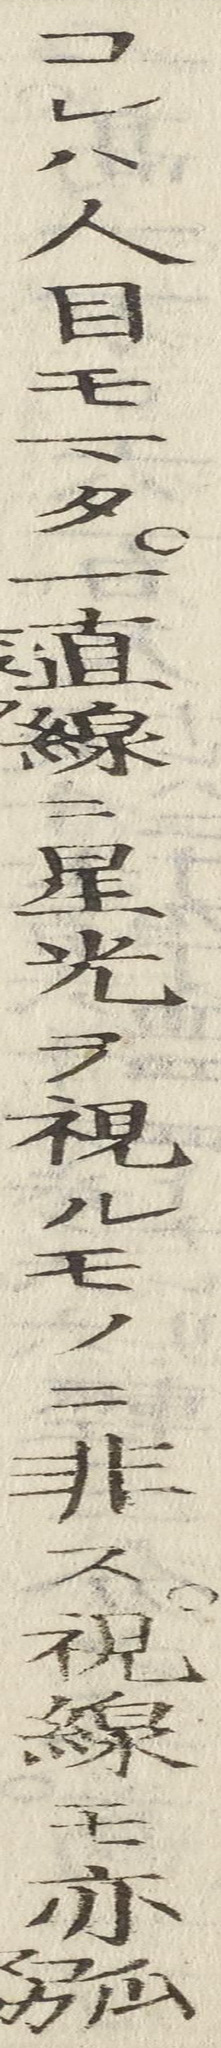コレハ人目モマタ。一直線ニ星光ヲ視ルモノニ非ス。視線モ亦弧
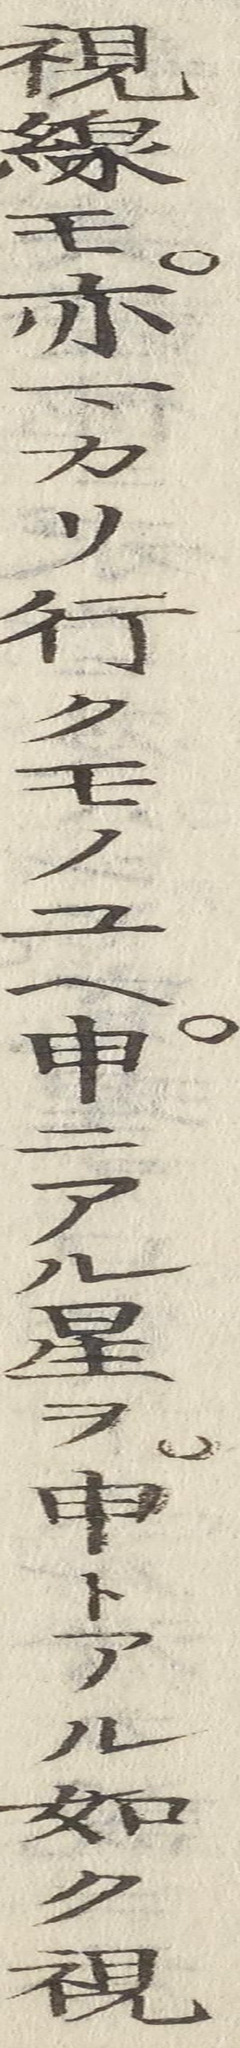視線モ。亦マカリ行クモノユヘ。申ニアル星ヲ。申トアル如ク視
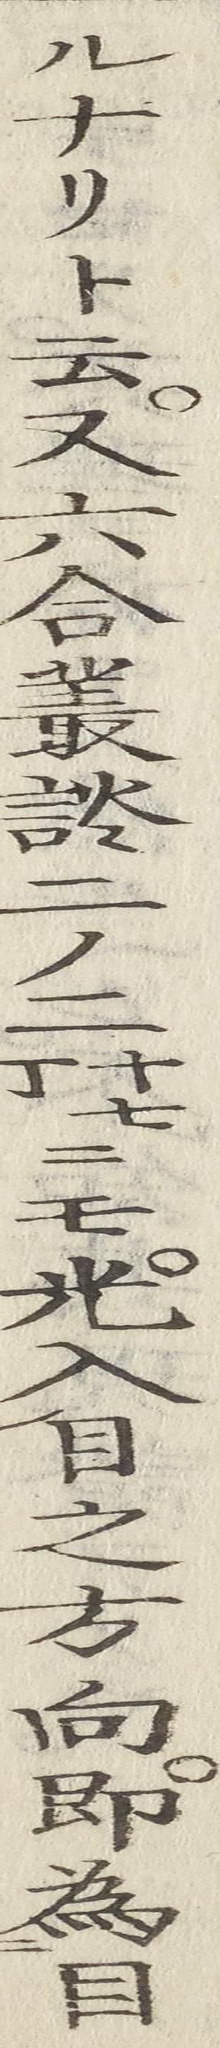ルナリト云。又六合叢談ニノニ十七丁ニモ。光入目之方向。即為ニ目
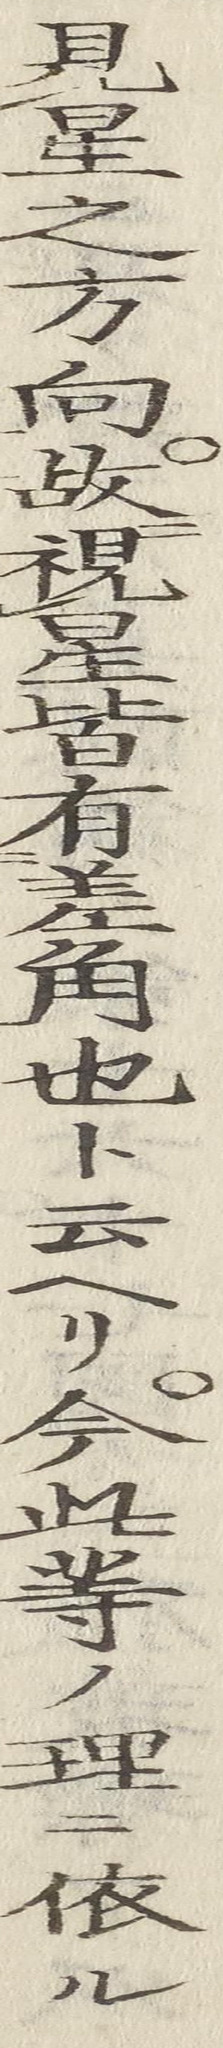月星之方向。故視星皆有ニ差角也ト云ヘリ。今此等ノ理ニ依ル
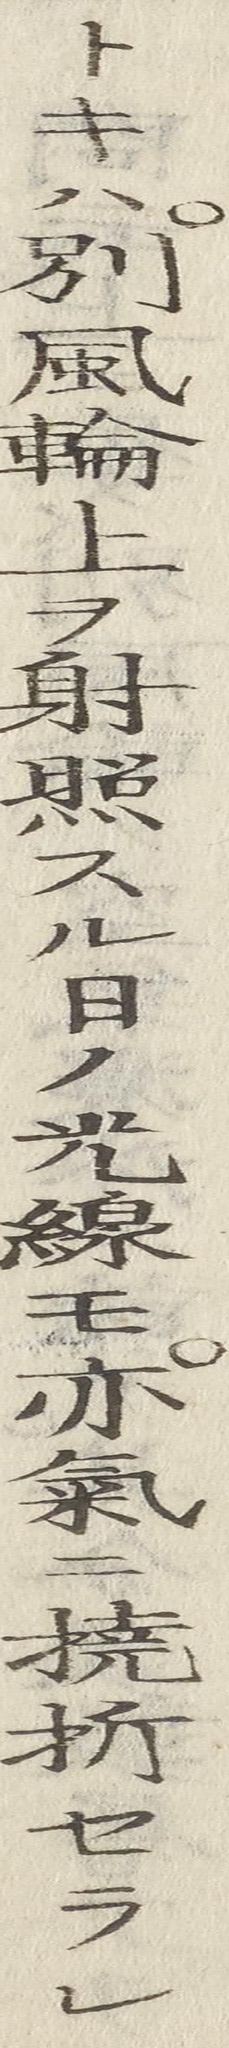トキハ。別風輪上ヲ射照スル日ノ光線モ。亦気ニ撓折セラレ
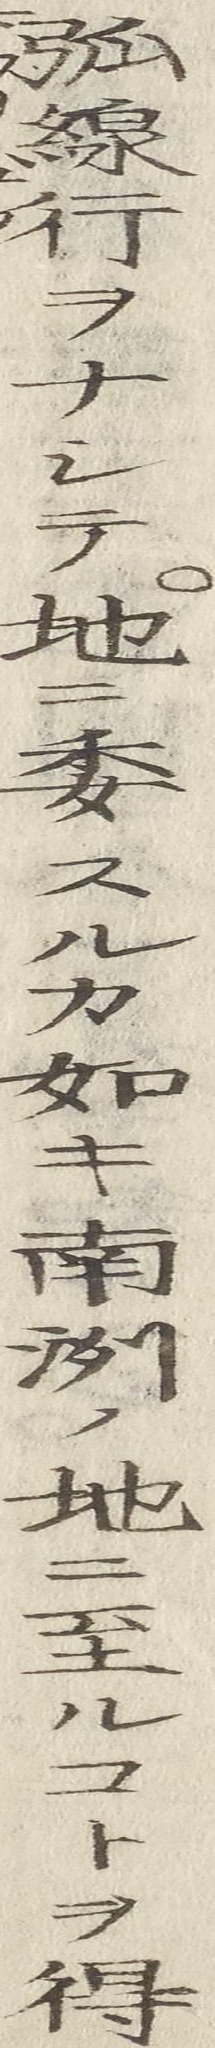弧線行ヲナシテ。地ニ委スルカ如キ南洲ノ地ニ至ルコトヲ得
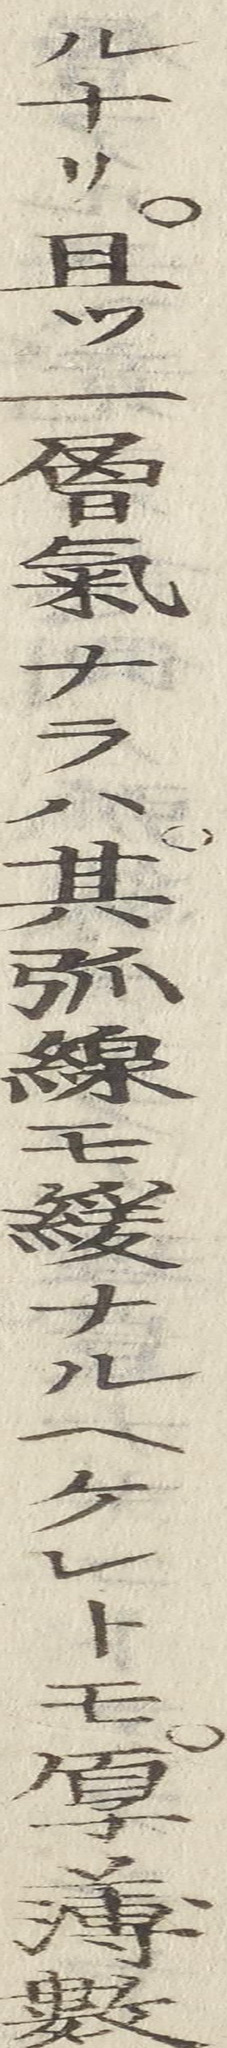ルナリ。且ツ一層気ナラハ。其弧線モ緩ナルヘケレトモ。厚薄数

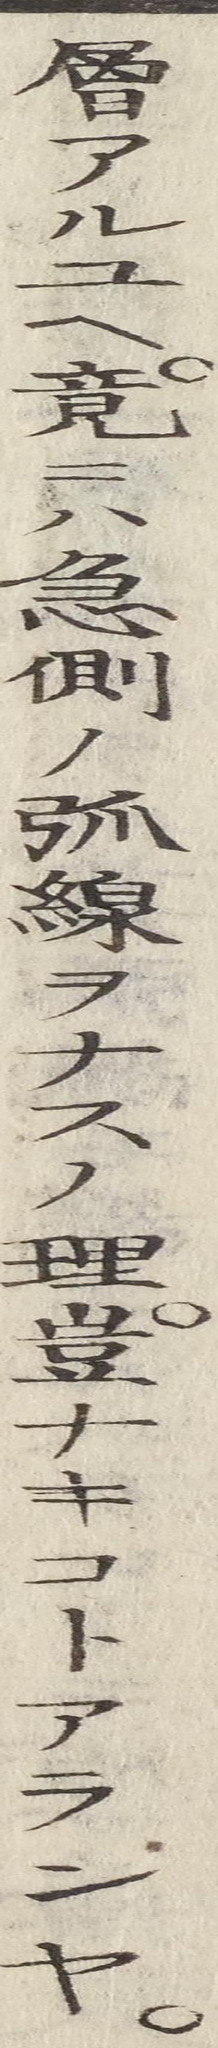層アルユヘ。竟ニハ急側ノ弧線ヲナスノ理。豈ナキコトアランヤ。
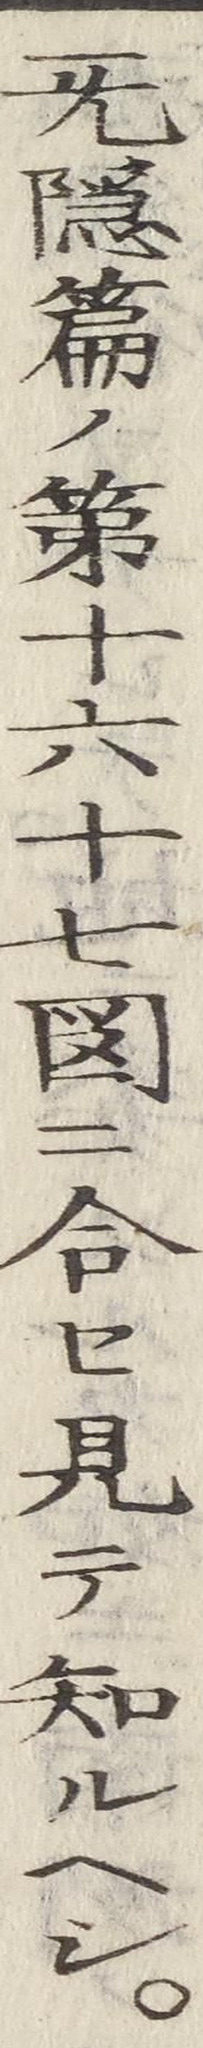尤隠篇ノ第十六十七図ニ合セ見テ知ルヘシ。
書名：護法新論　二編　上
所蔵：東京大学地震研究所図書室 Earthquake Research Institute Library, The University of Tokyo, JAPAN
